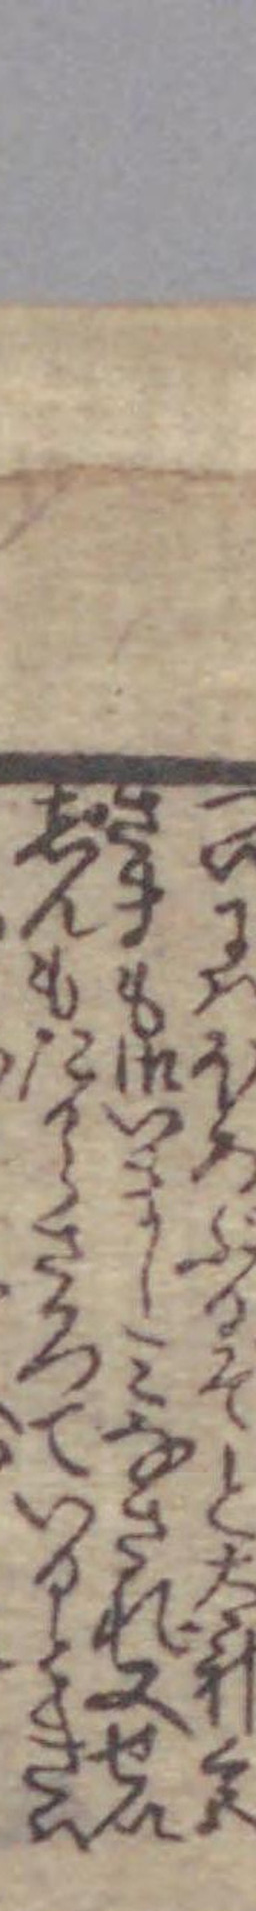じんもたからさかつているときは
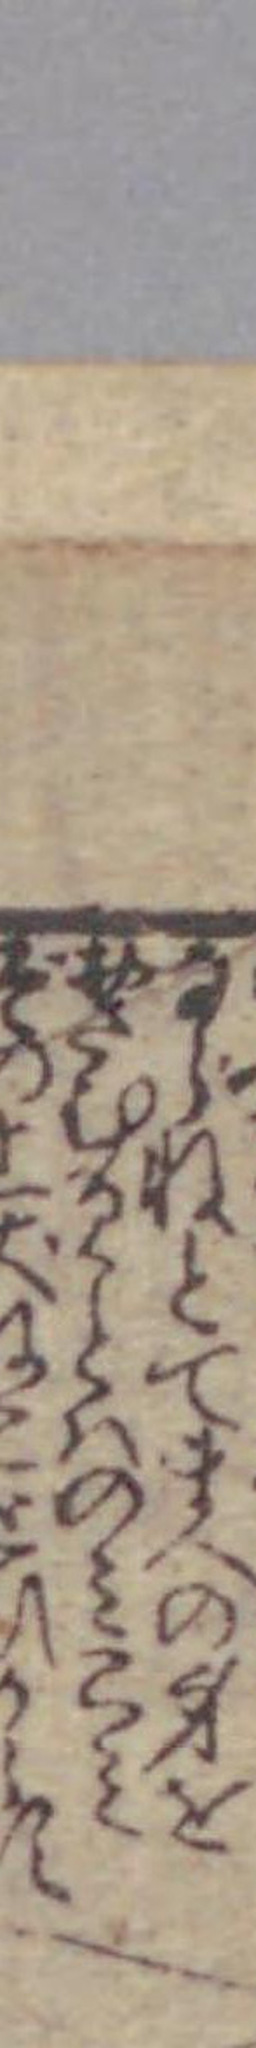おさむることはのみこみ
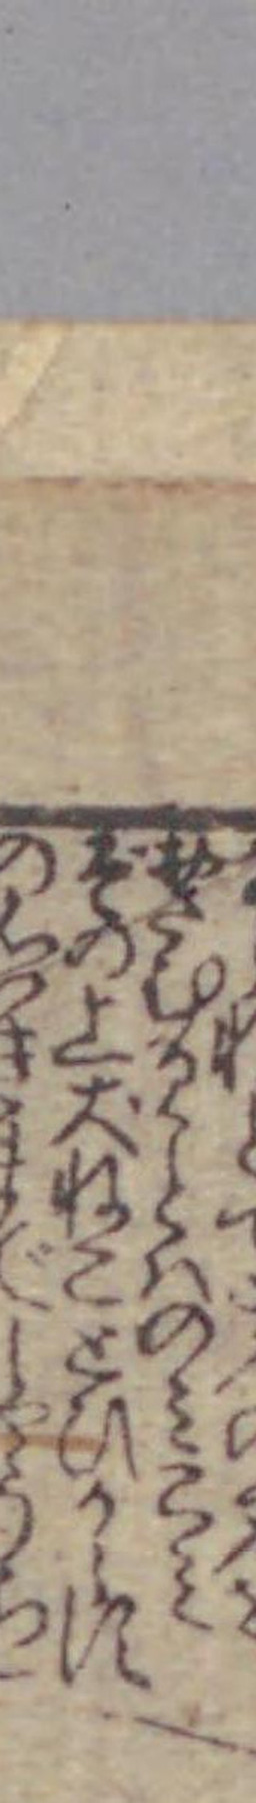その上犬ねことひからす
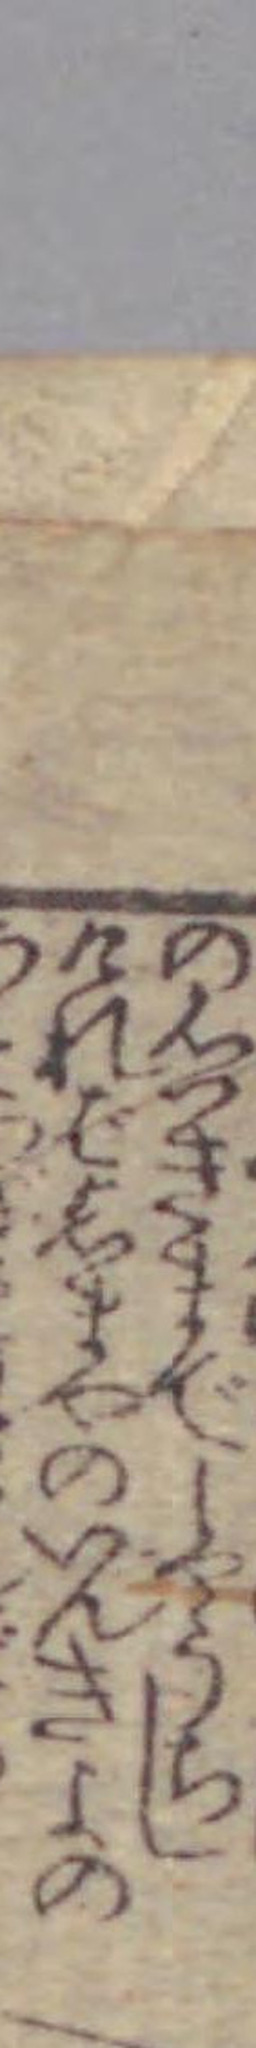ければしまやのいんきよの
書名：即席耳学問 : 3巻
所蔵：国立国会図書館 National Diet Library, JAPAN
